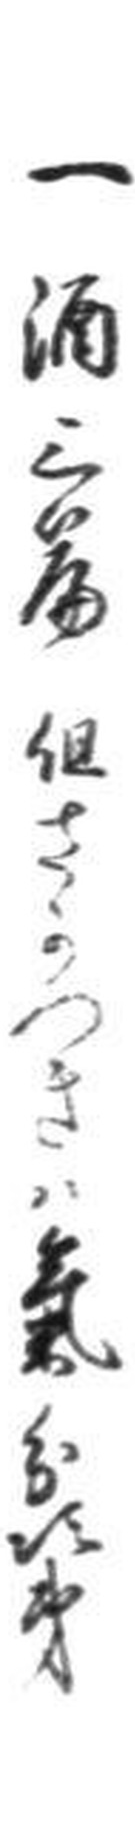一酒三篇但さかつきは気分次第

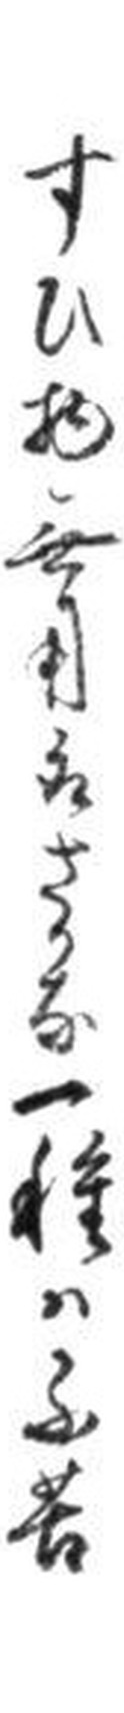すひ物無用取さかな一種は不苦
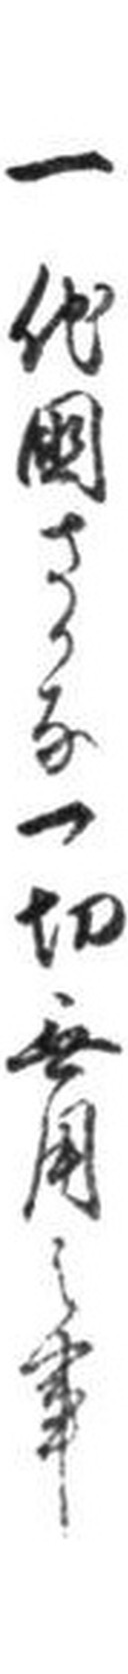一他国さかな一切無用之事
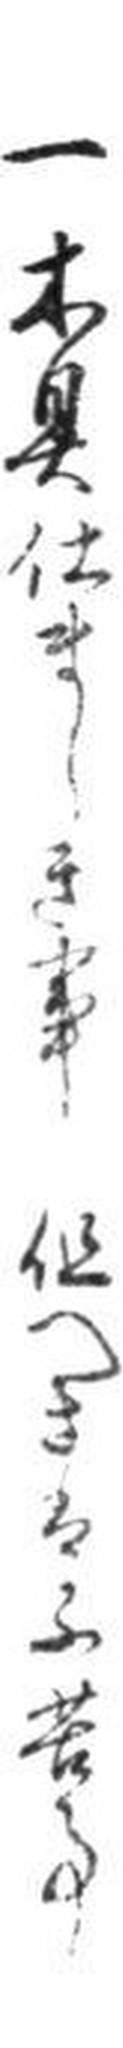一木具仕ましき事但へきは不苦事
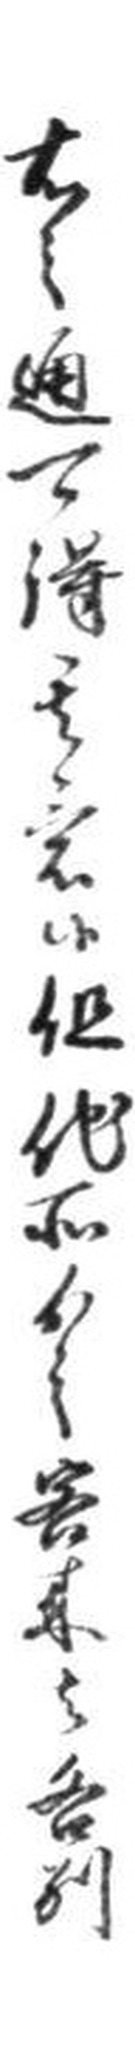右之通可得其意候但他所ゟ之客来は各別
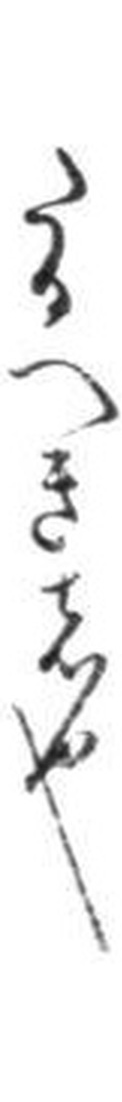たるへき者也
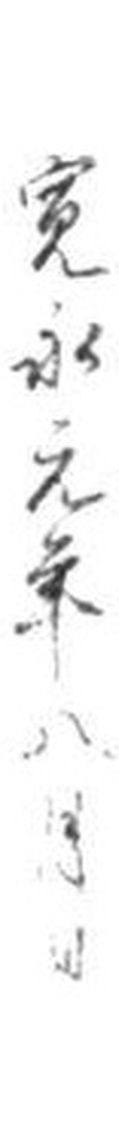寛永元年八月日
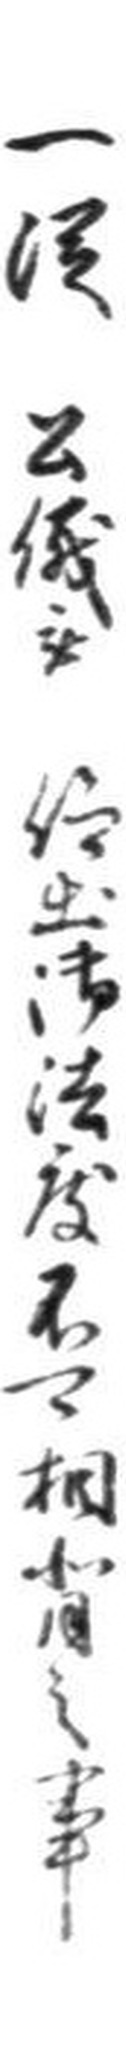一従公儀被仰出御法度不可相背之事
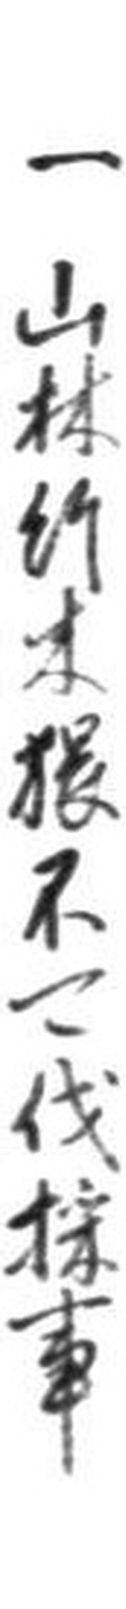一山林竹木根不可伐採事
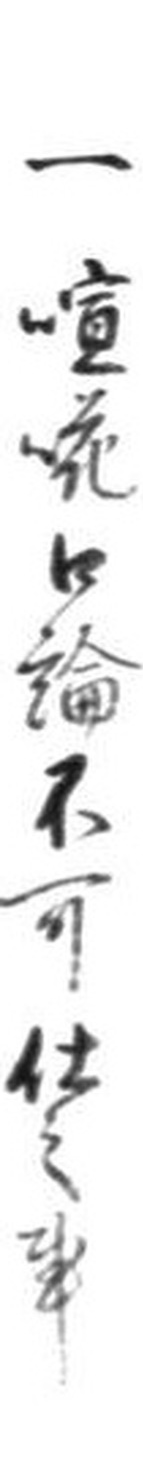一喧嘩口論不可仕之事
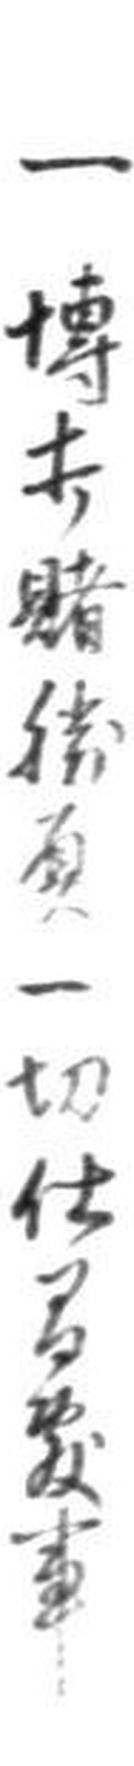一博打賭勝負一切仕間敷事
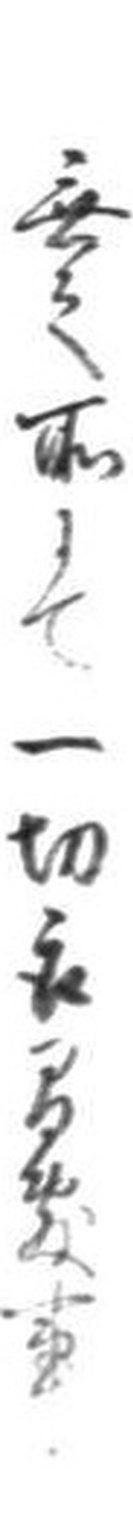無之所にて一切取間敷事
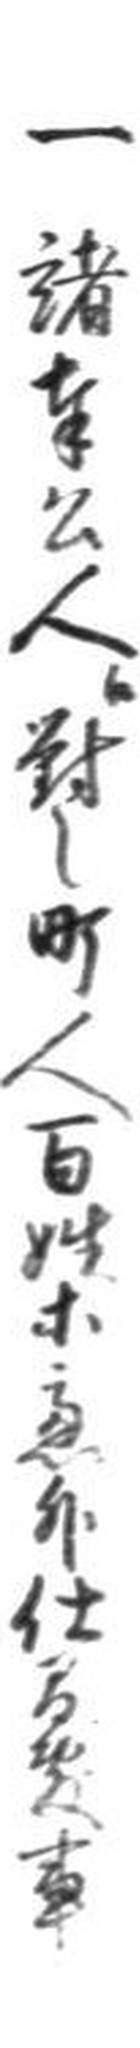一諸奉公人江対し町人百姓等慮外仕間敷事
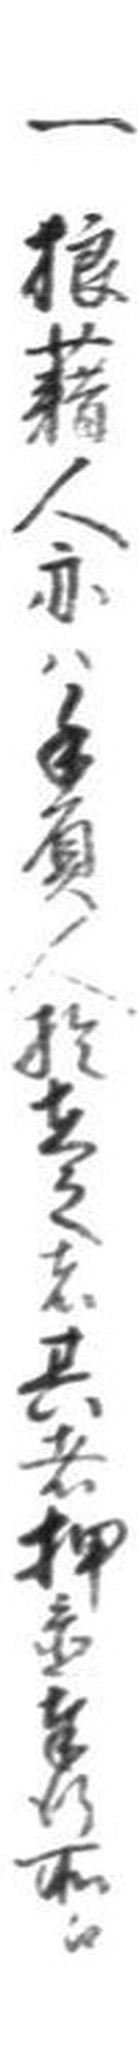一狼藉人亦は手負人於在之者其者押置奉行所江
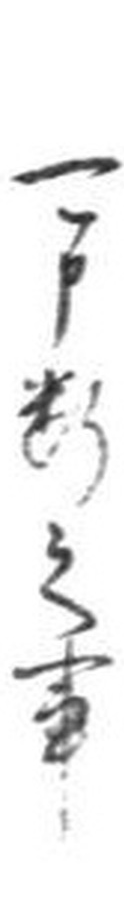可申断之事
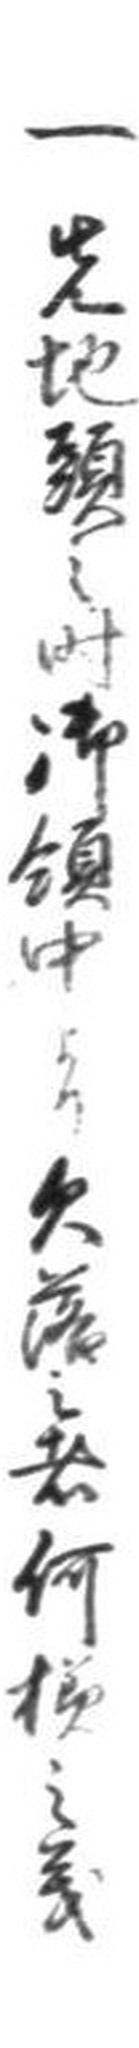一先地頭之時御領中より欠落之者何様之義
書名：家譜 三 忠昌公 従慶長八年到寛永六年
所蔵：福井県文書館 Fukui Prefectural Archives
